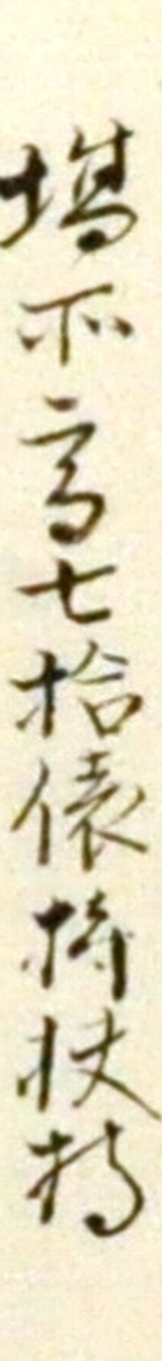場所高七拾俵持扶持
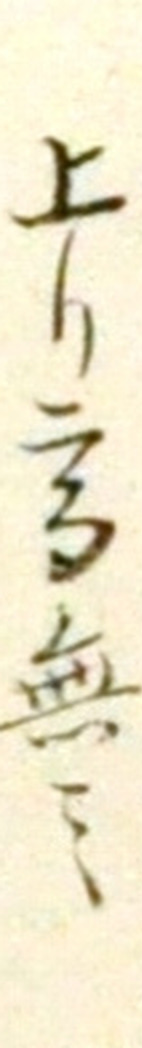上り高無之
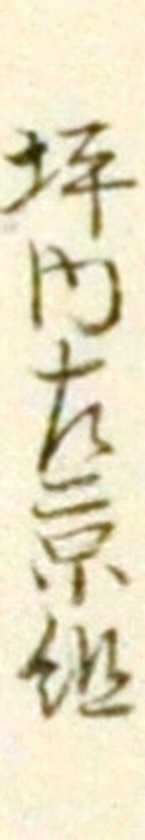坪内左京組
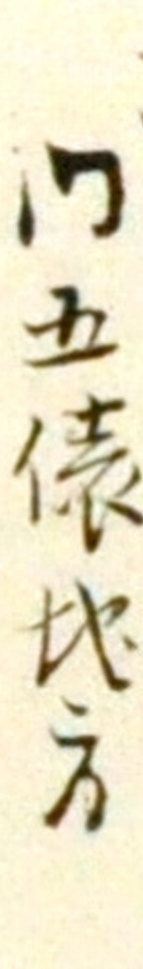内五俵地方
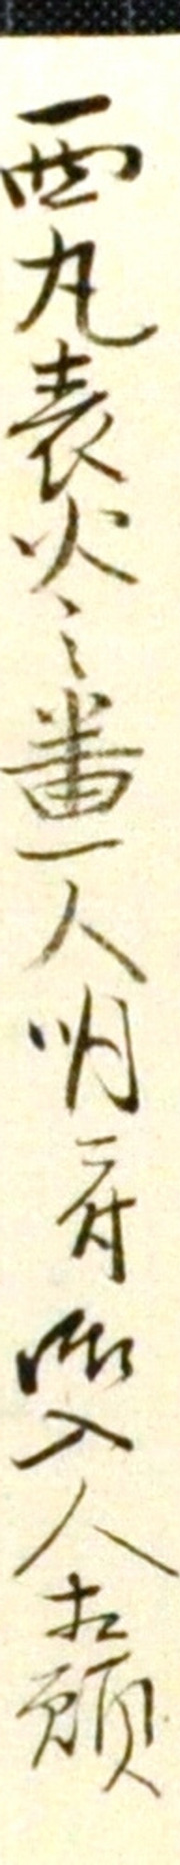西丸表火之番一人明ニ付御入人相願
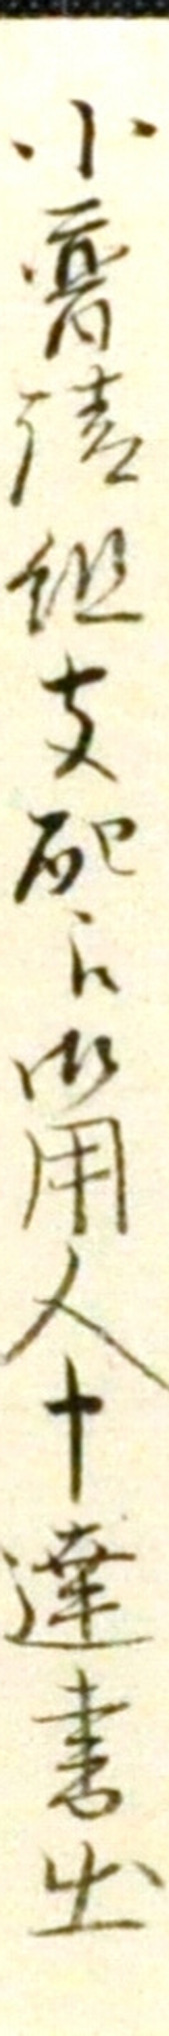小普請組支配江御用人申達書出
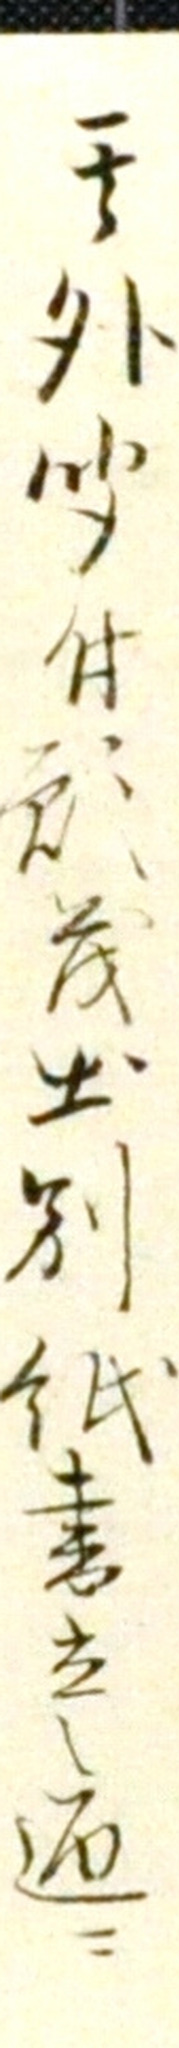其外聞付願茂出別紙書立之通ニ
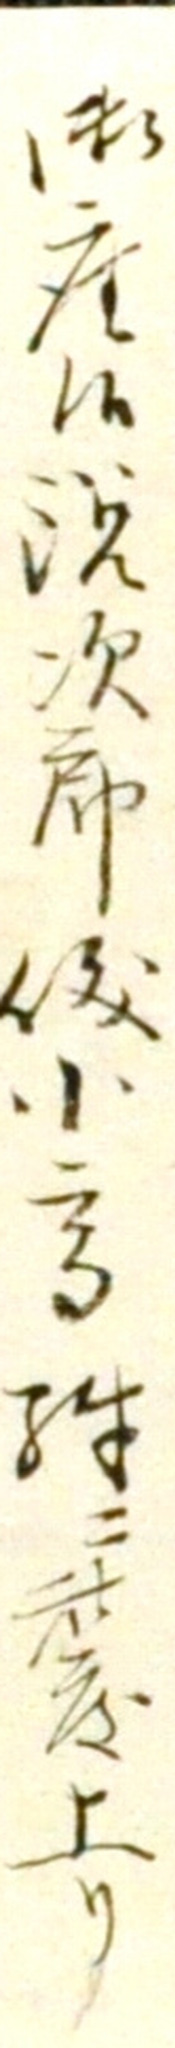御座候鋭次郎儀小高殊ニ此度上リ
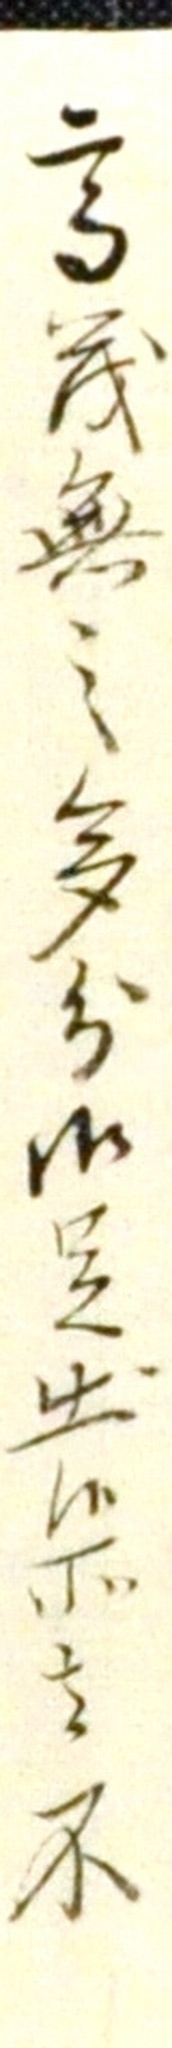高茂無之多分御足出候所者不
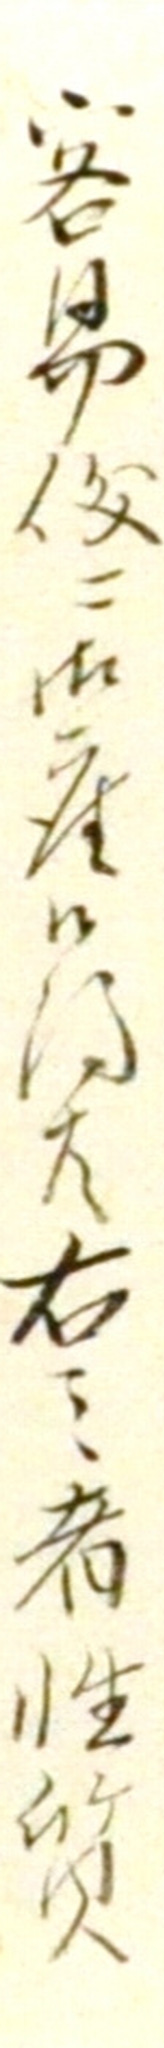容易儀ニ御座候得共右之者性質
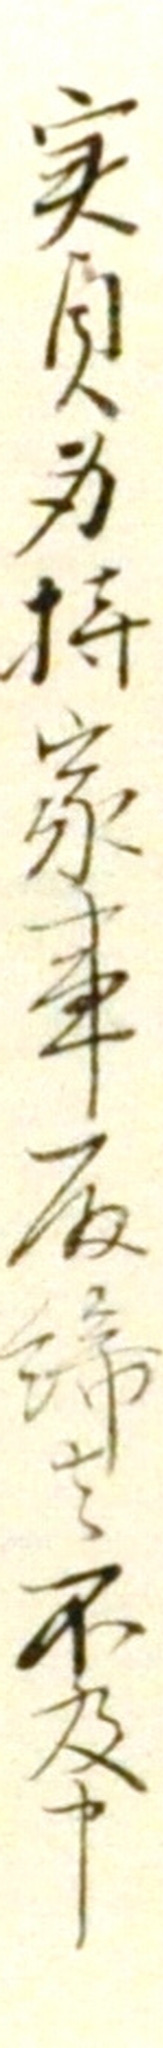実貞身持家事取締は不及申
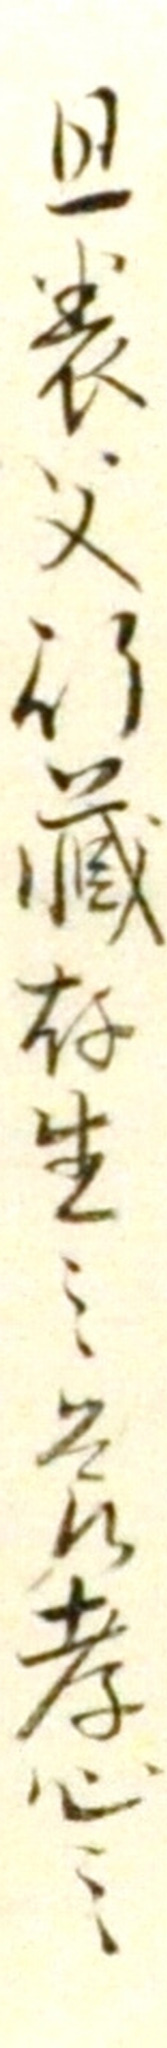且養父行蔵存生之節孝心之
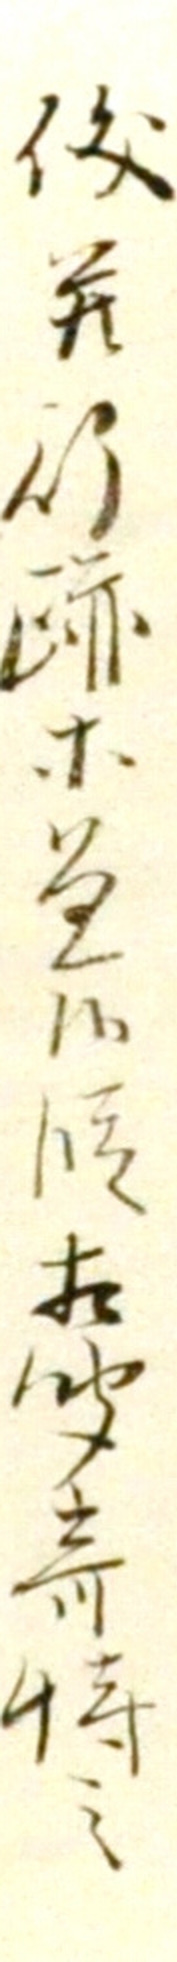儀并行跡等兼候段相聞奇特之
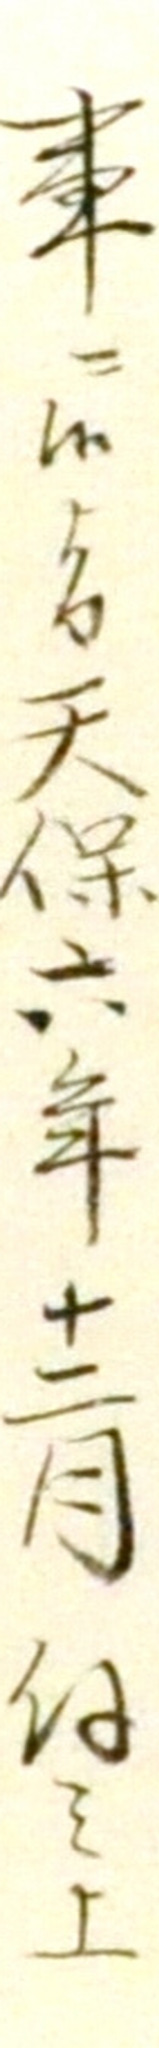事ニ候旨天保六年十二月伺之上
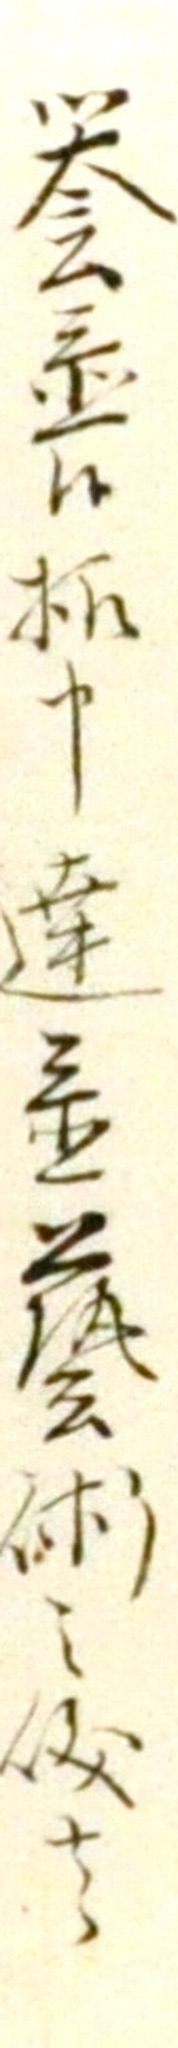誉置候様申達置芸術之儀者
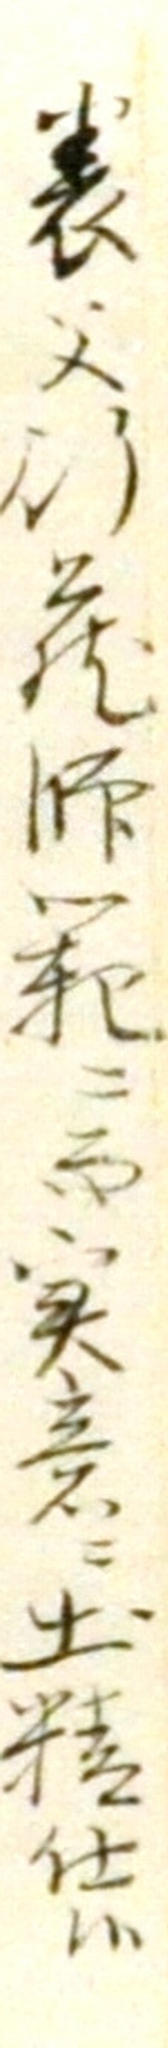養父行蔵師範ニ而実意に出精仕候
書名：西丸表火之番調
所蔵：伊那市立高遠町図書館・合同会社AMANE
